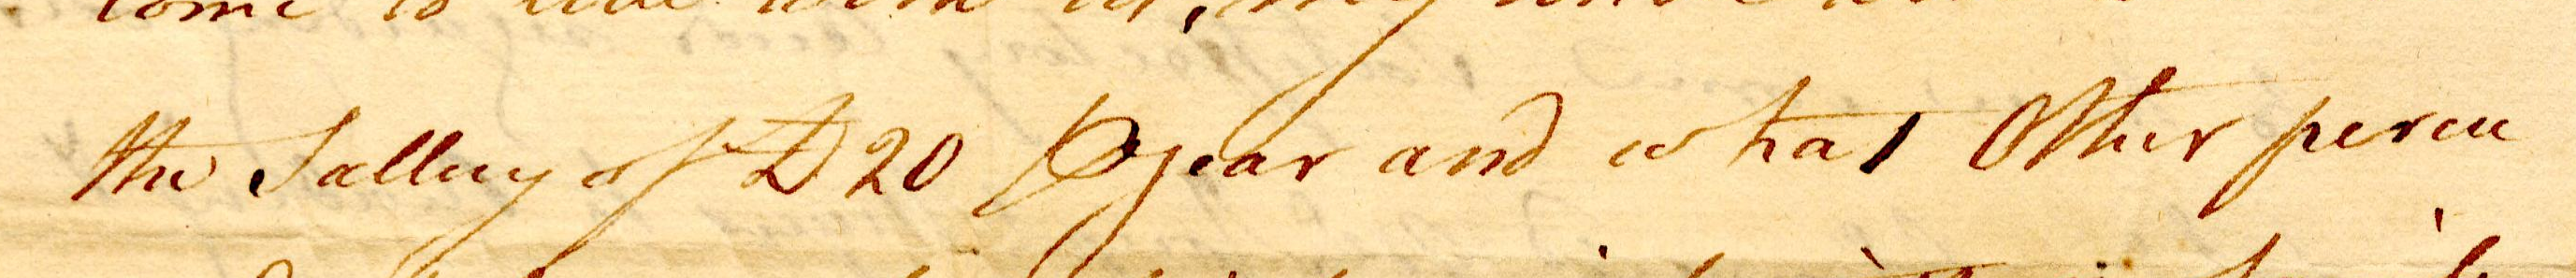The Sallary of £20 per year and what other percu-
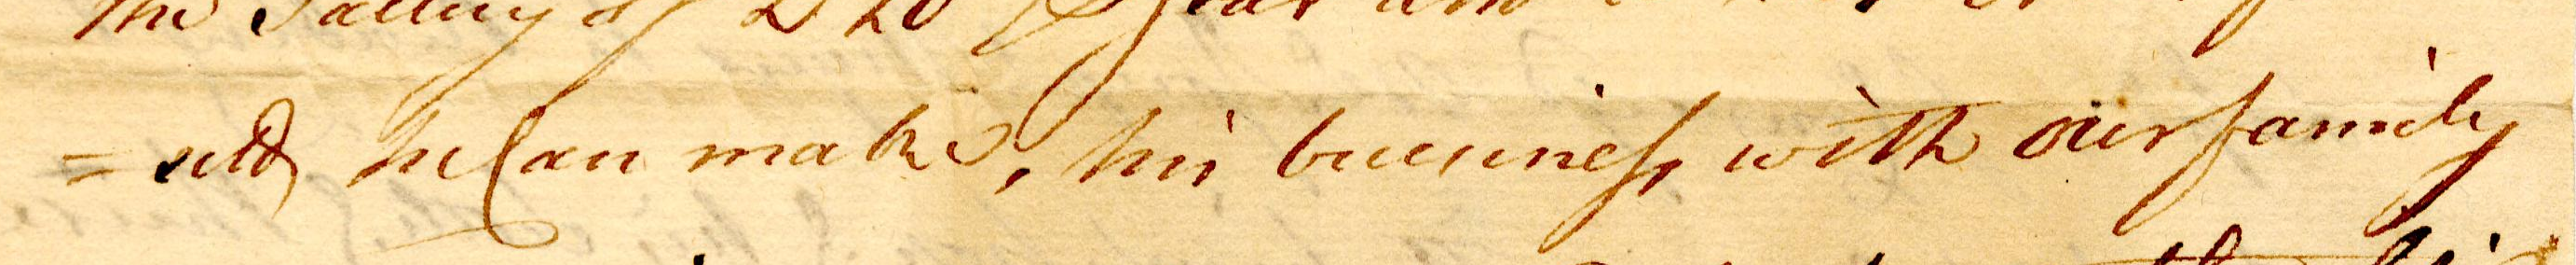-seld he can make, his business with our family
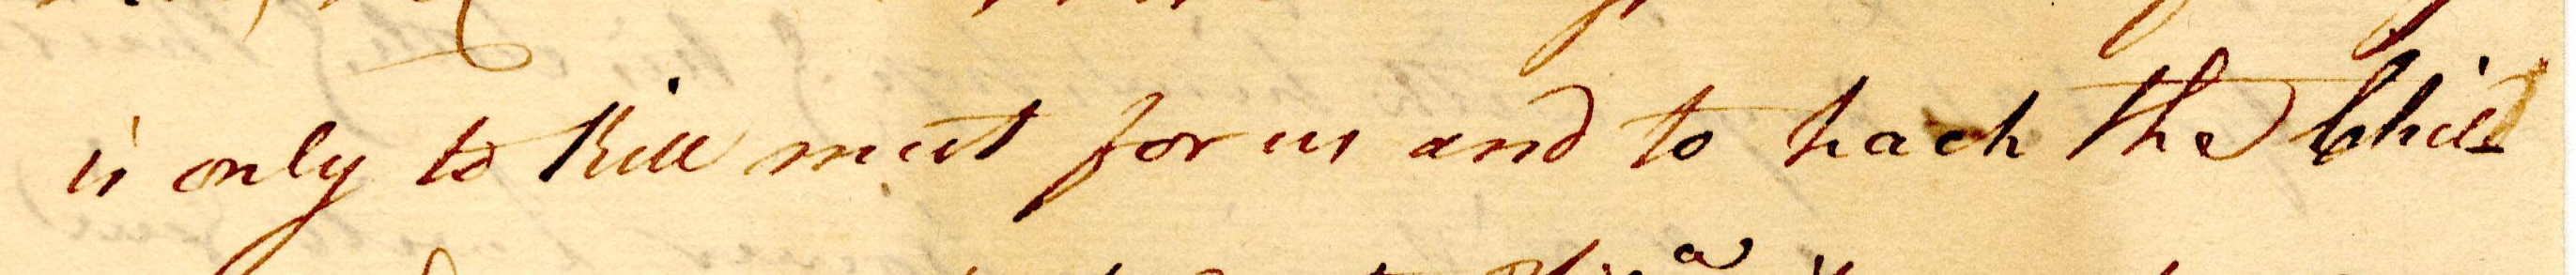is only to kill meet for us and to teach the Chil-
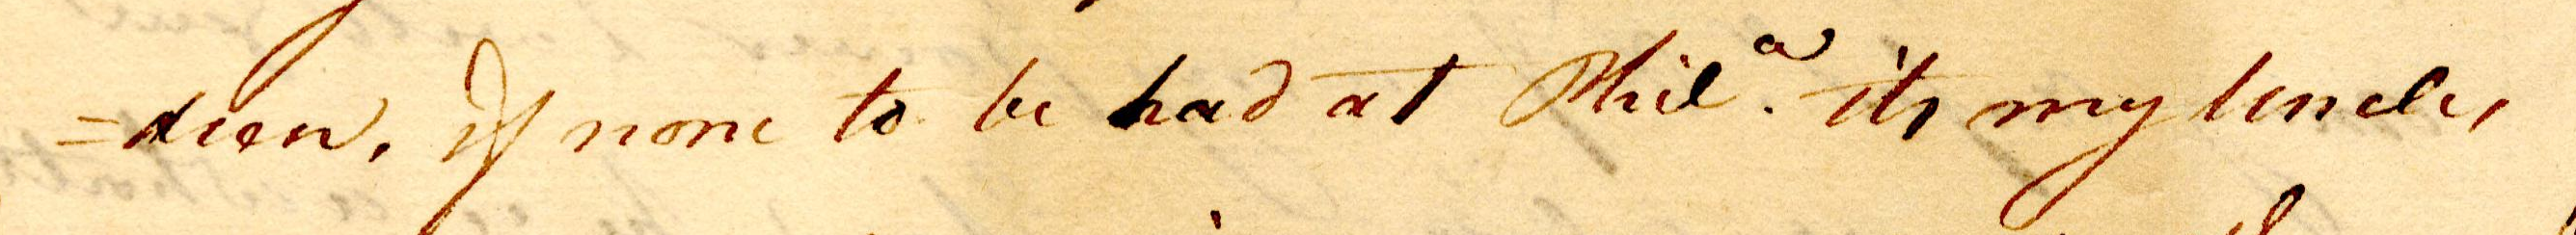-dren, if none to be had at Phil^a. its my uncle
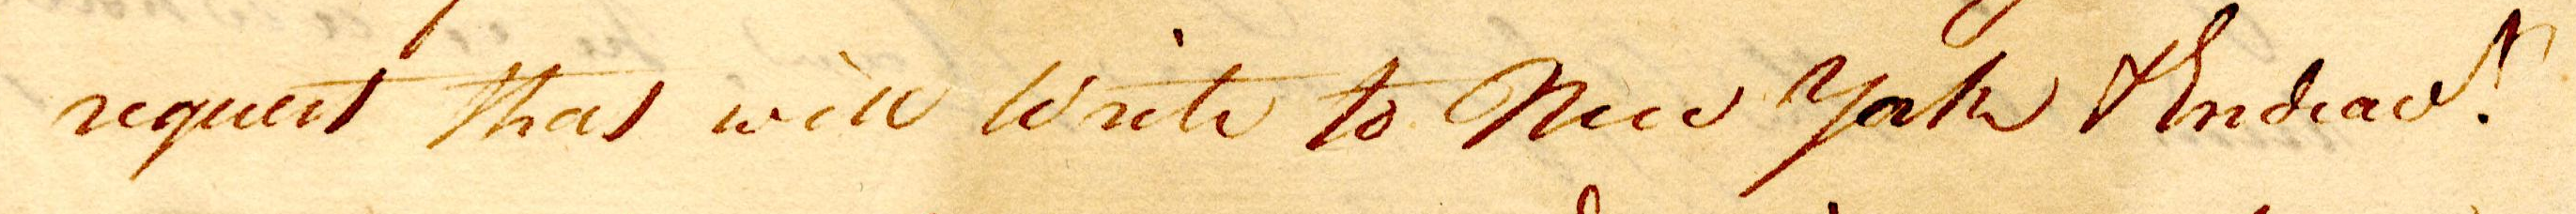request that will Write to New York & Endeav^r.
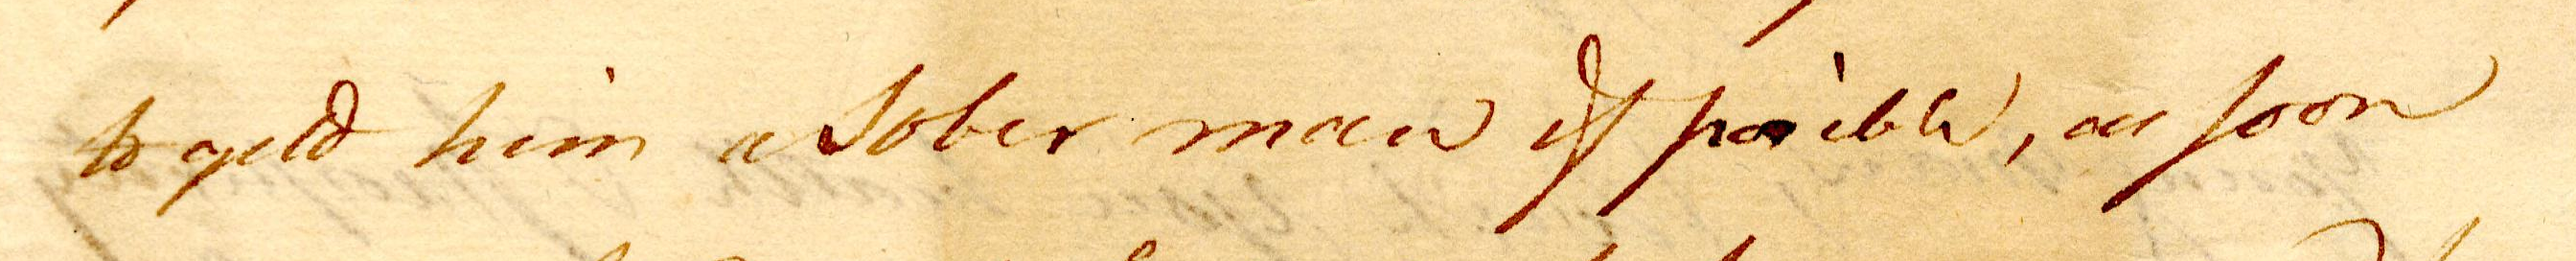to geld him a sober man if possible, as soon
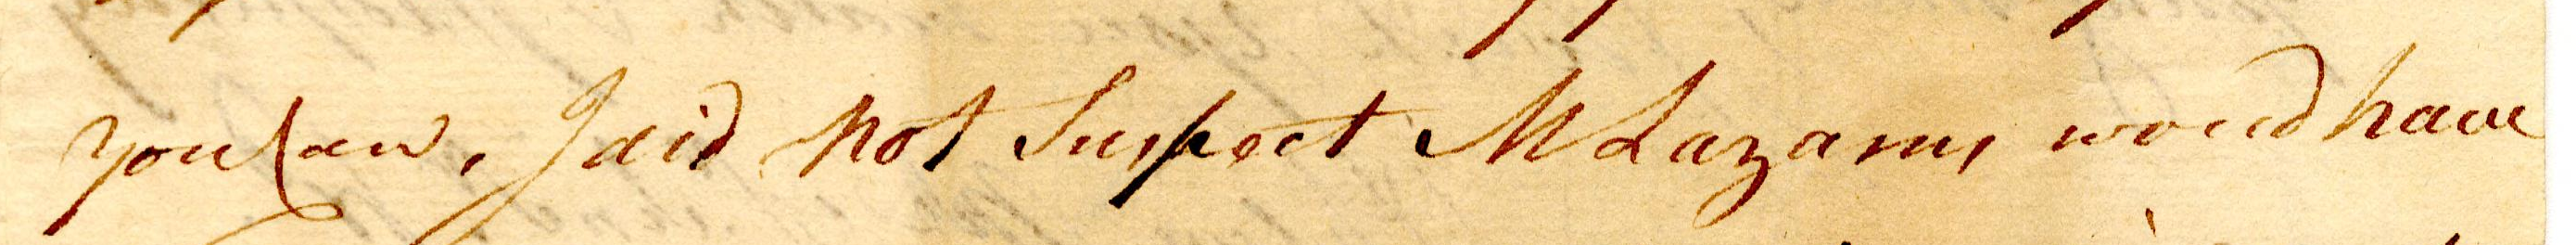you Can, I did not Suspect M Lazarus woud have
